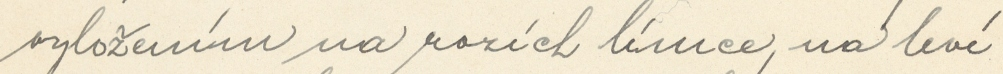vyložením na rozích límce, na levé
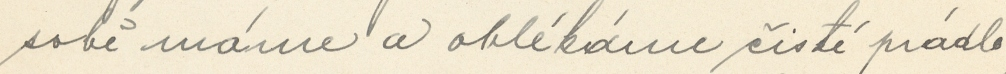sobě máme a oblékáme čisté prádlo
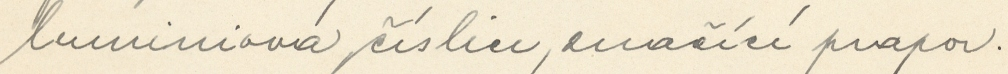luminiová číslice, značící prapor.
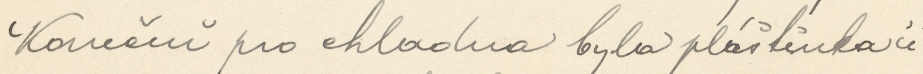Konečně pro chladna byla pláštěnka či
